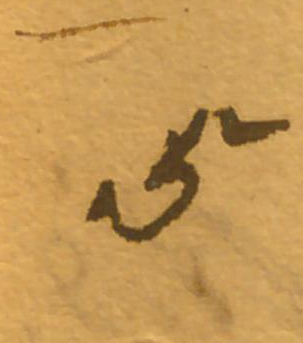5
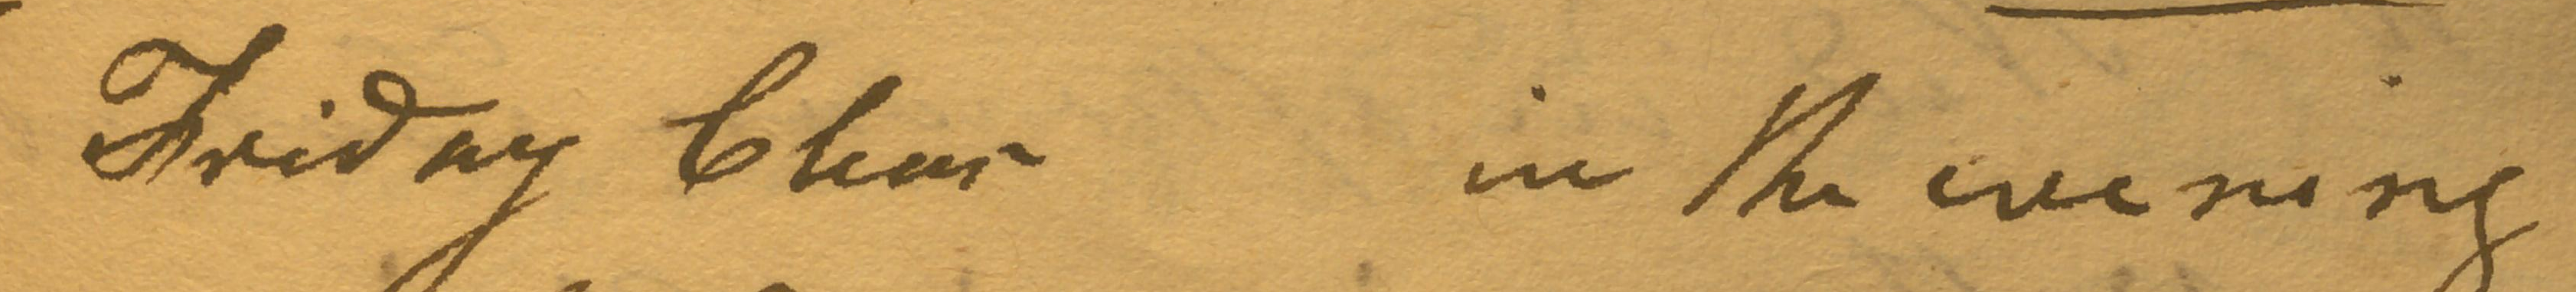Friday Clear in the evening
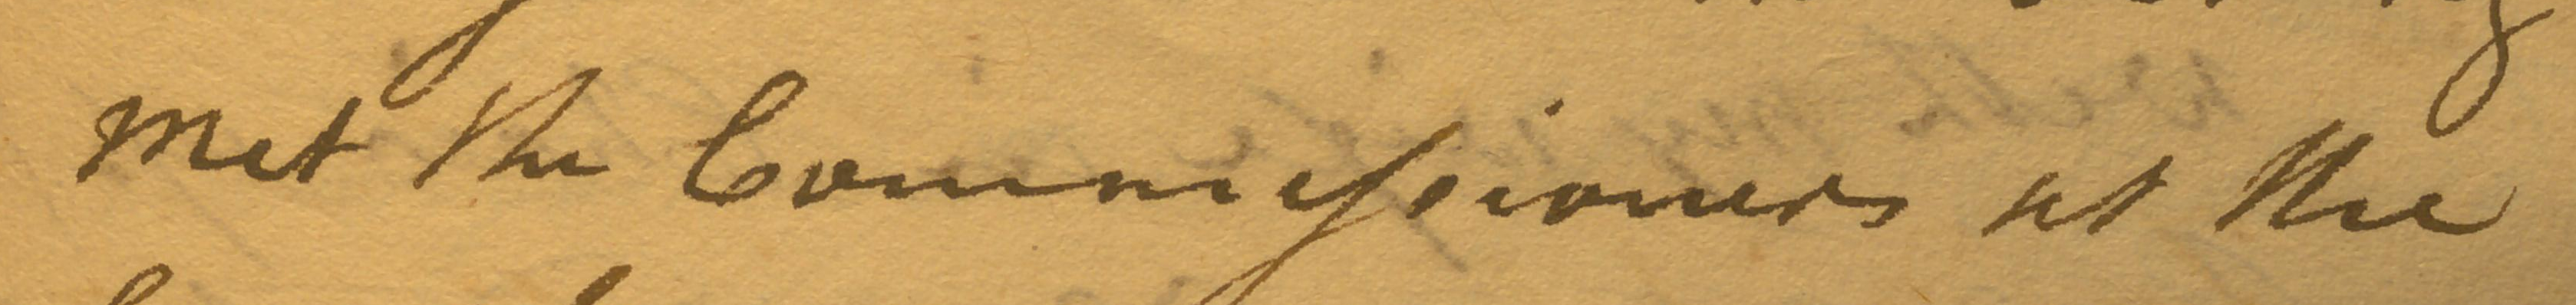met the Commissioners at the
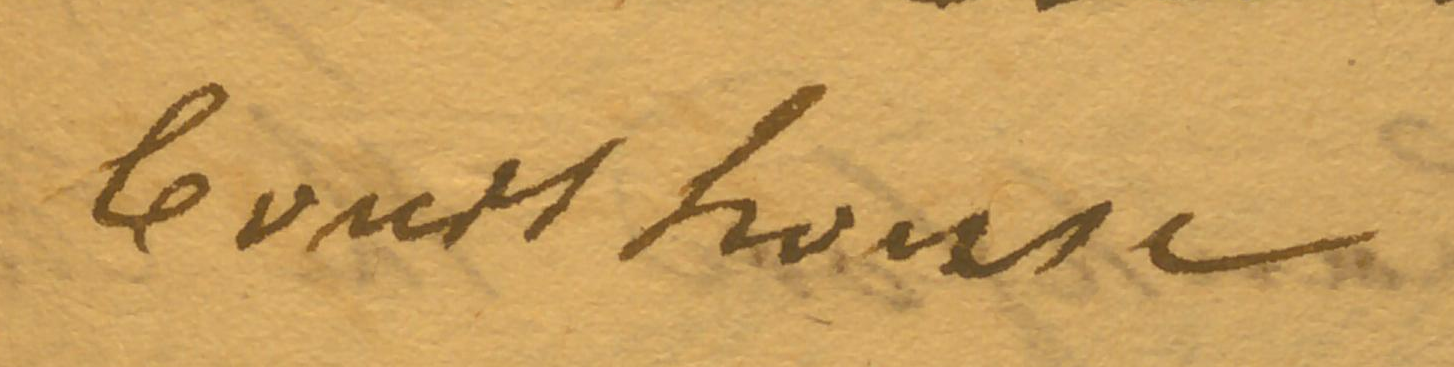Court house
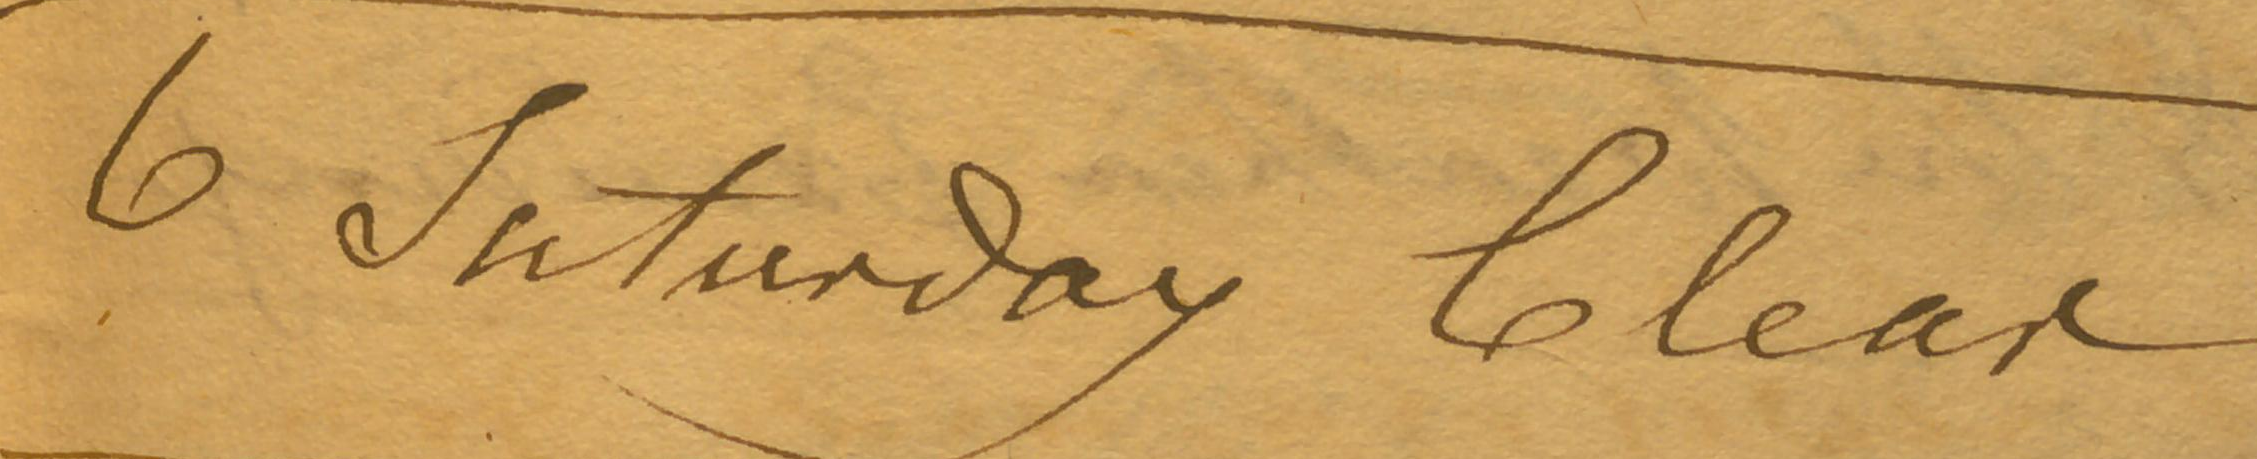6 Saturday Clear
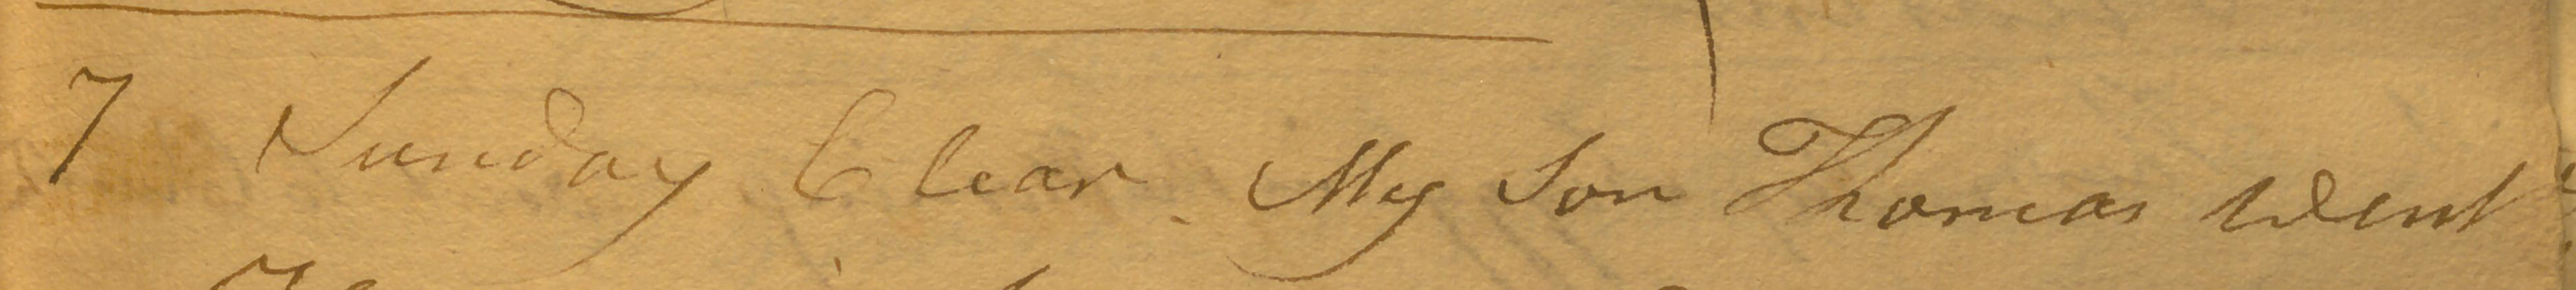Sunday Clear My Son Thomas went
